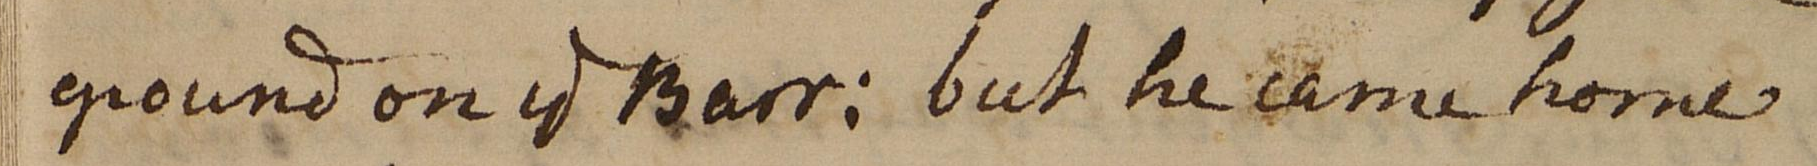ground on y^e Barr: but he came home
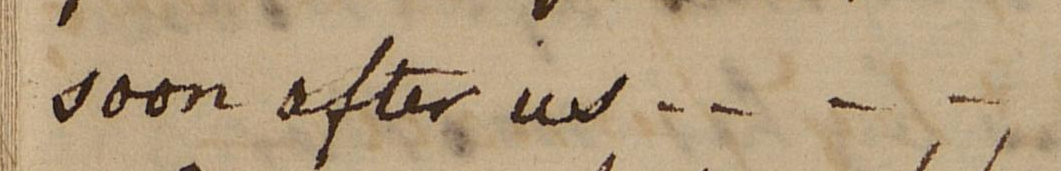soon after us---
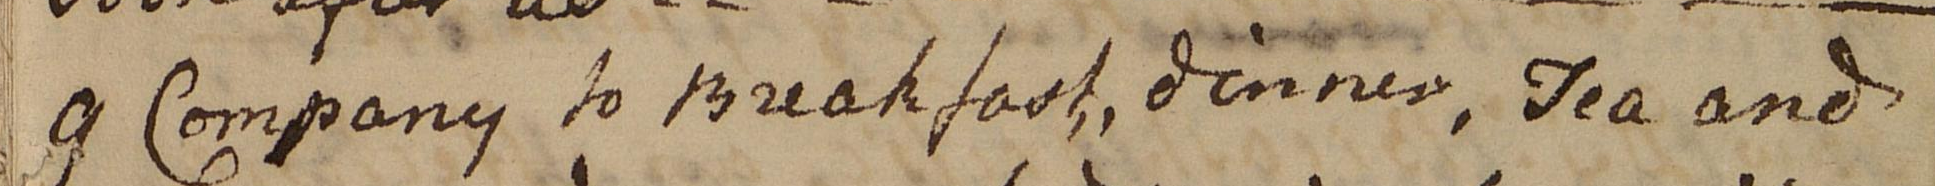9 Company to Breakfast, dinner, Tea and
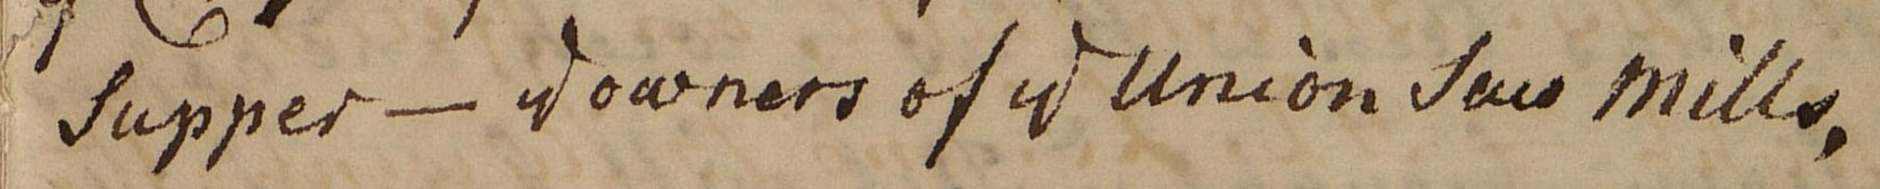Supper- y^e owners of y^e Union Saw Mills
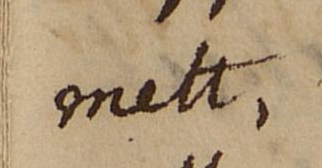mett,
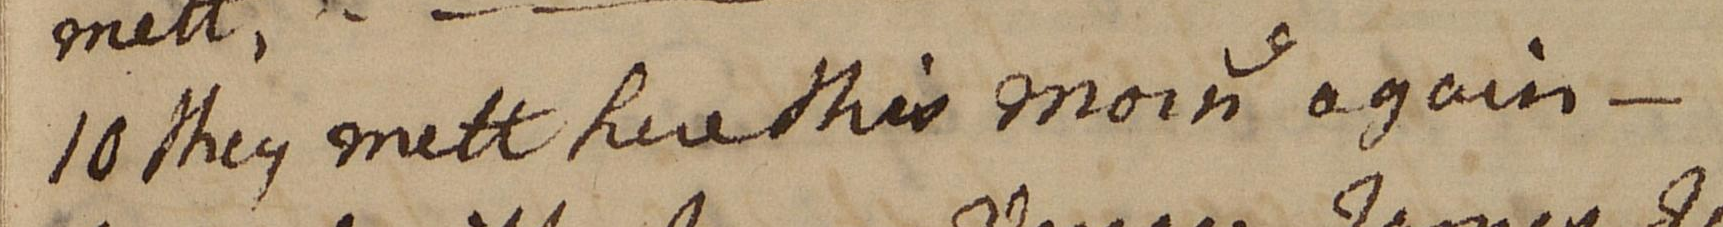10 they mett here this morn^g again-
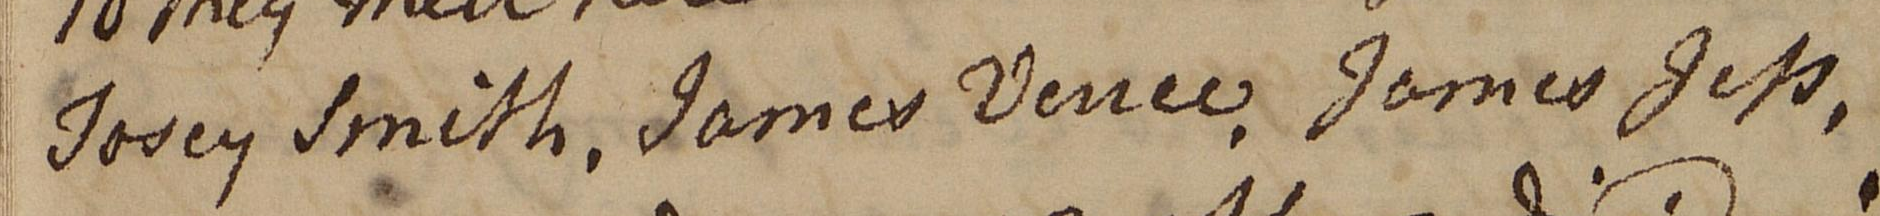Josey Smith, James Venee, James Jess,
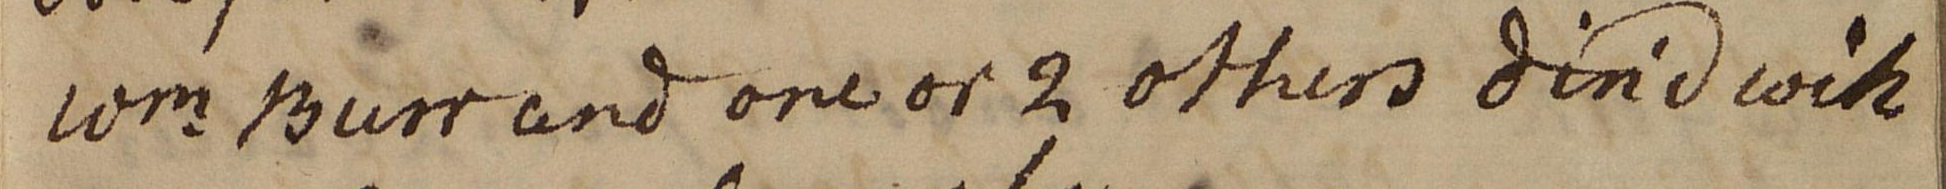W^m Burr and one or 2 others din'd with
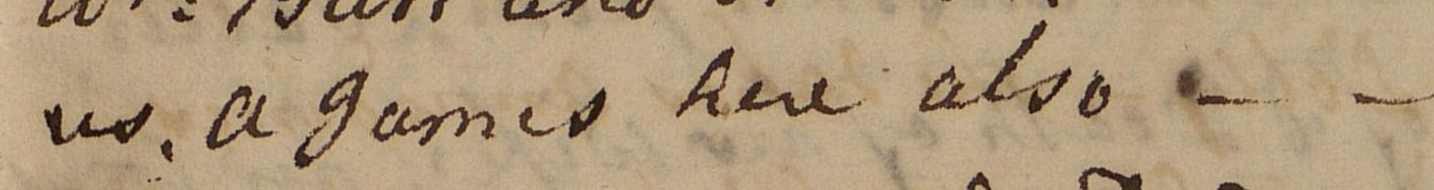us, A James here also
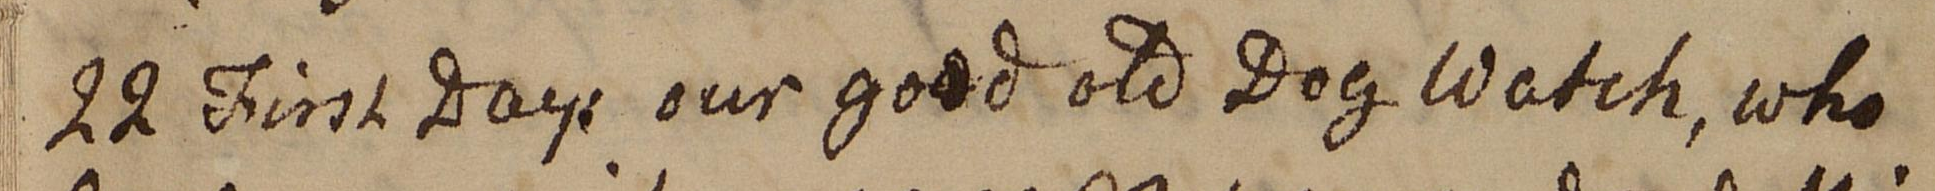22 First Day our good old Dog Watch, who
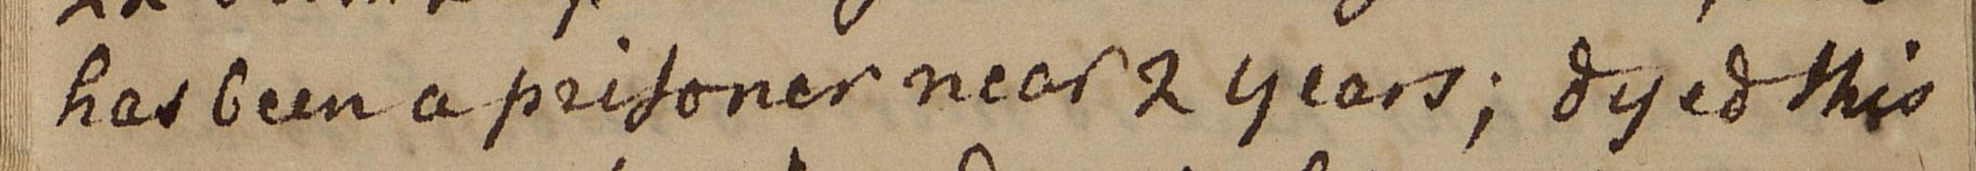has been a prisoner near 2 years; dyed this
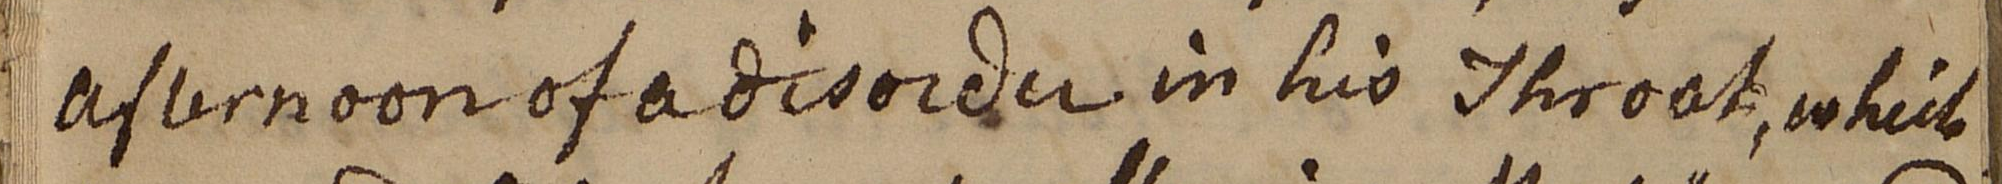afternoon of a disorder in his Throat, which
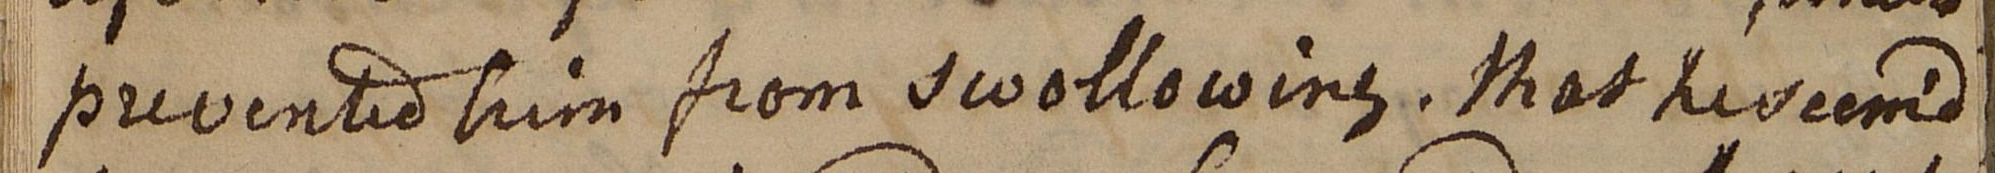prevented him from swollowing. that he seem'd
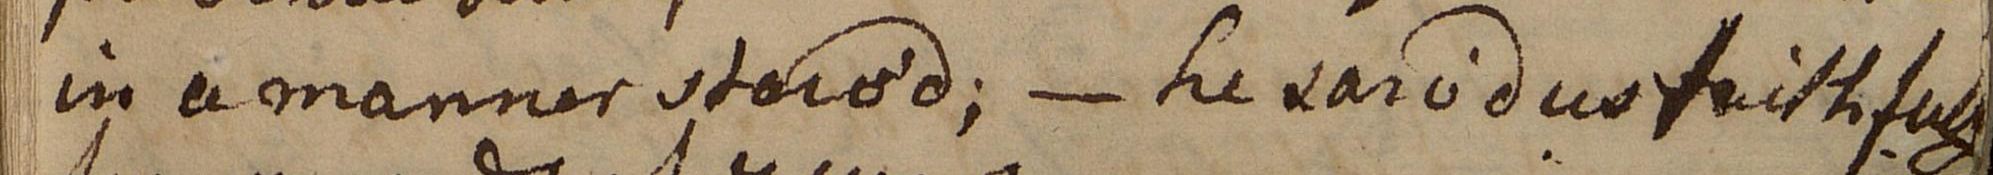in a manner starv'd;- he [sarv'd] us faithfuly
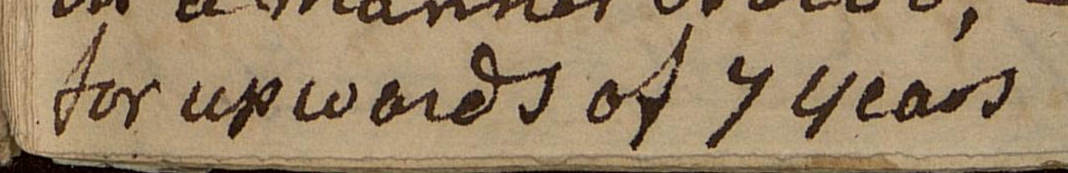for upwards of 7 years
